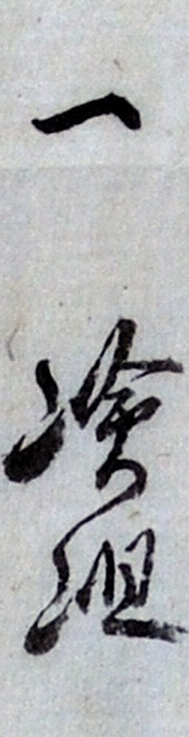一嶮岨
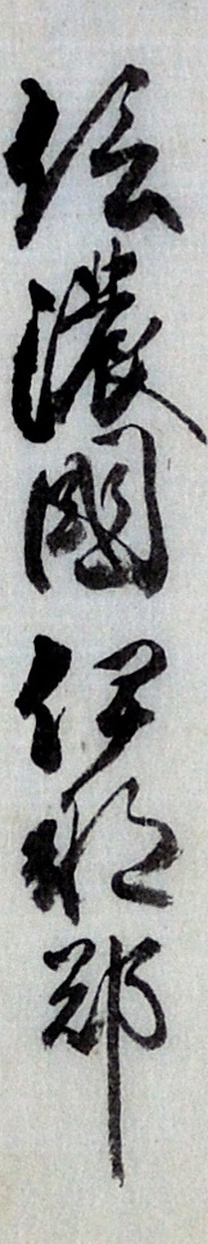信濃国伊那郡
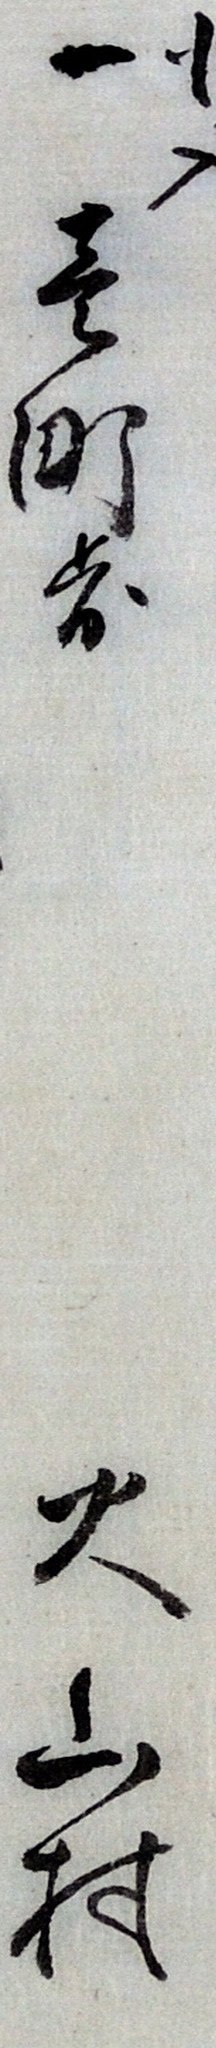一壱町歩火山村
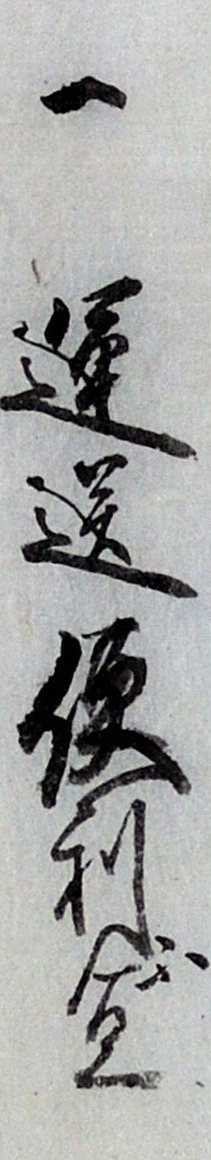一運送便利不宜
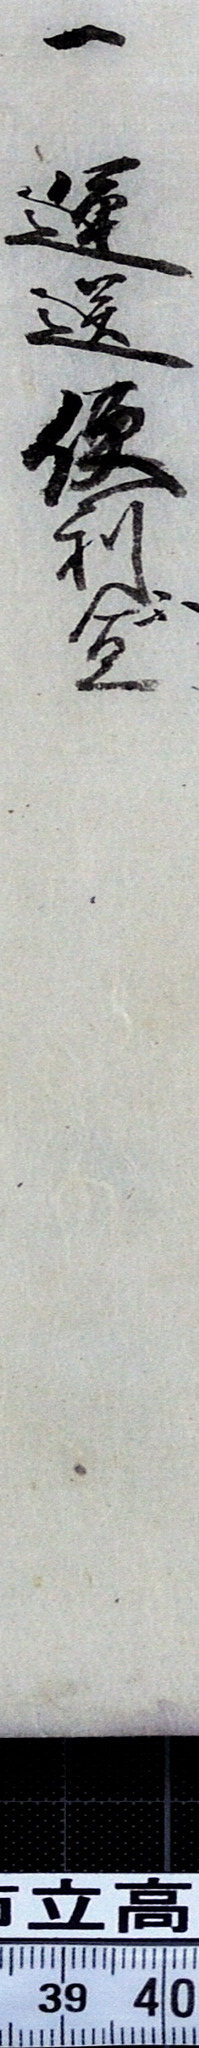一運送便利不宜

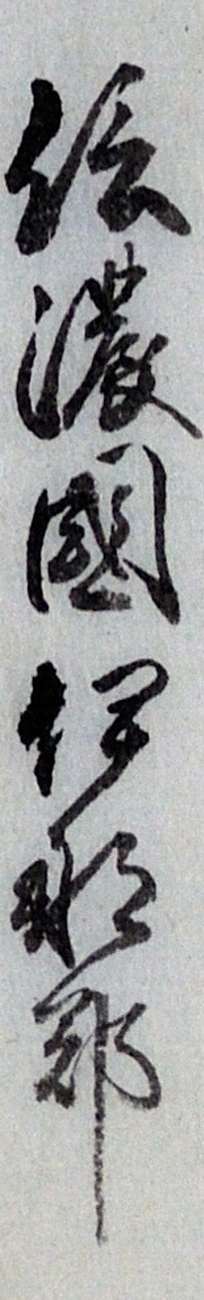信濃国伊那郡
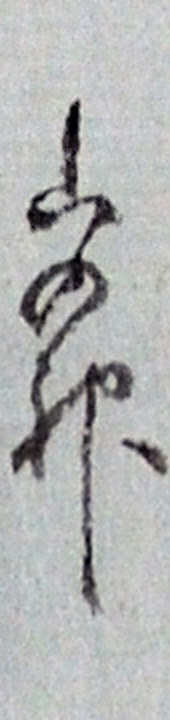山の神
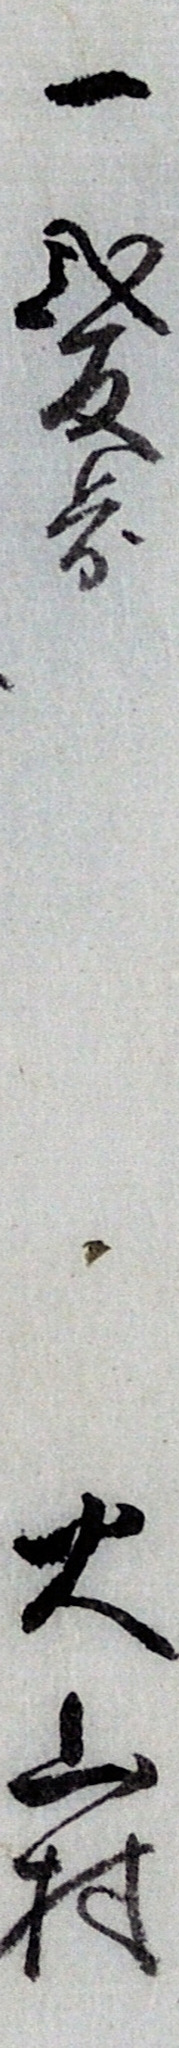一弐反歩火山村
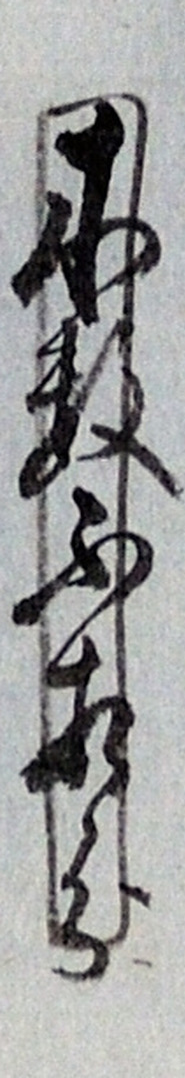木数不相分
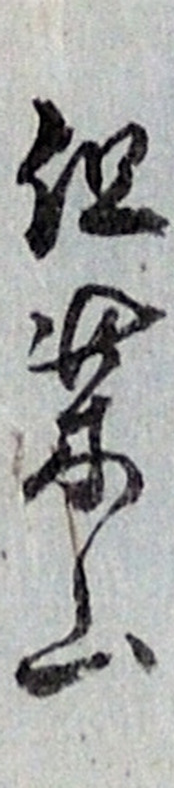但芝山
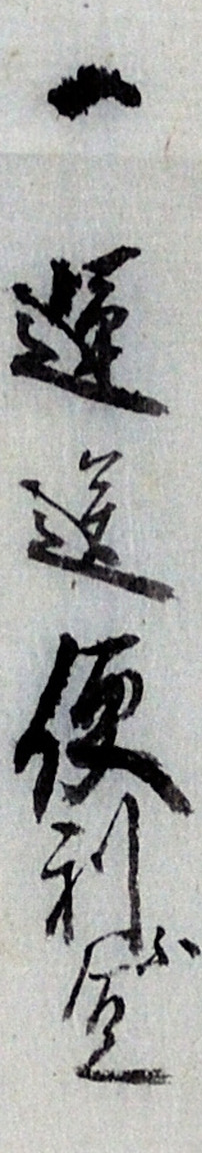一運送便利不宜
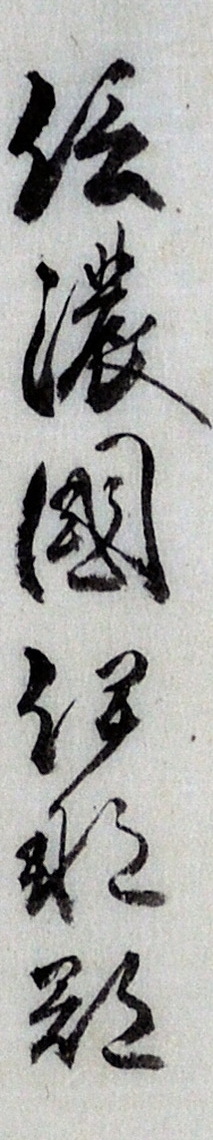信濃国伊那郡
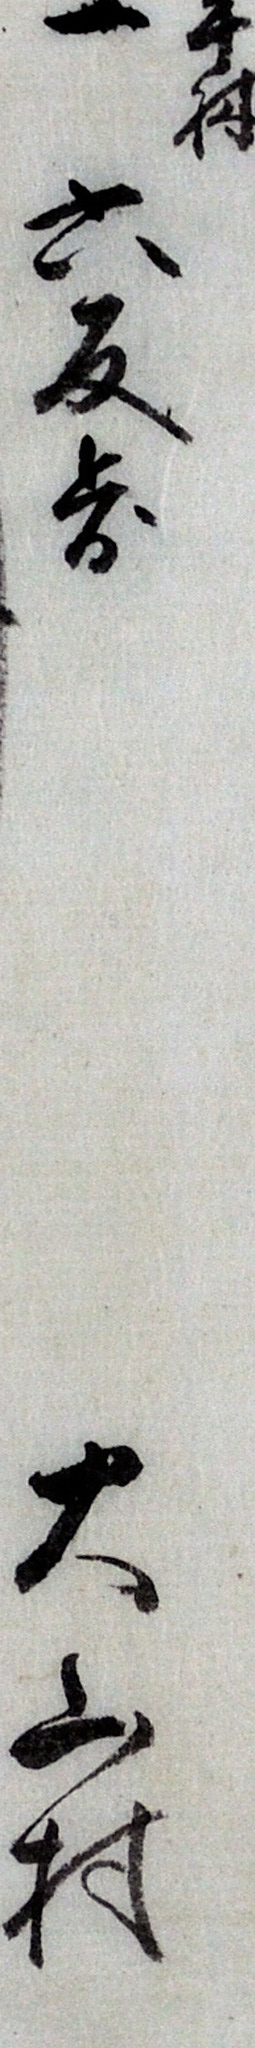一六反歩火山村
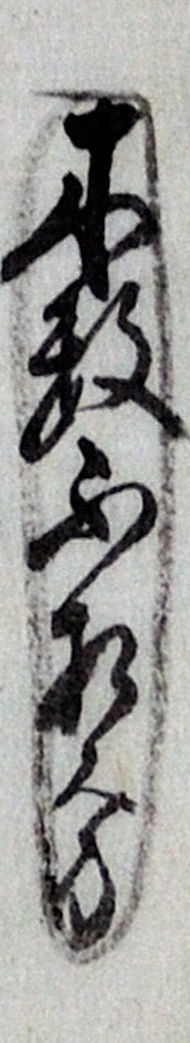木数不相分
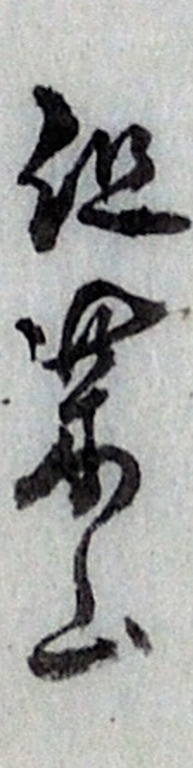但芝山
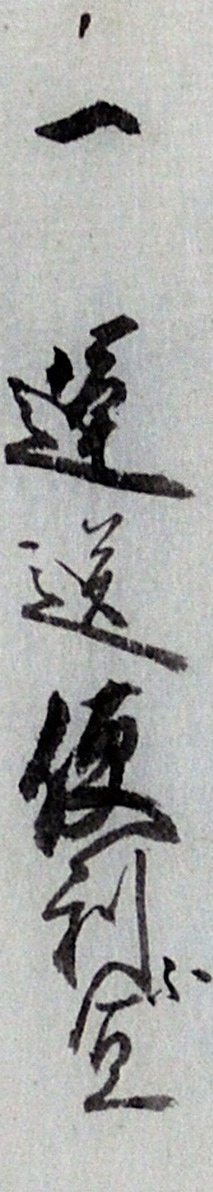一運送便利不宜
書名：官林反別帳
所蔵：伊那市立高遠町図書館・合同会社AMANE
